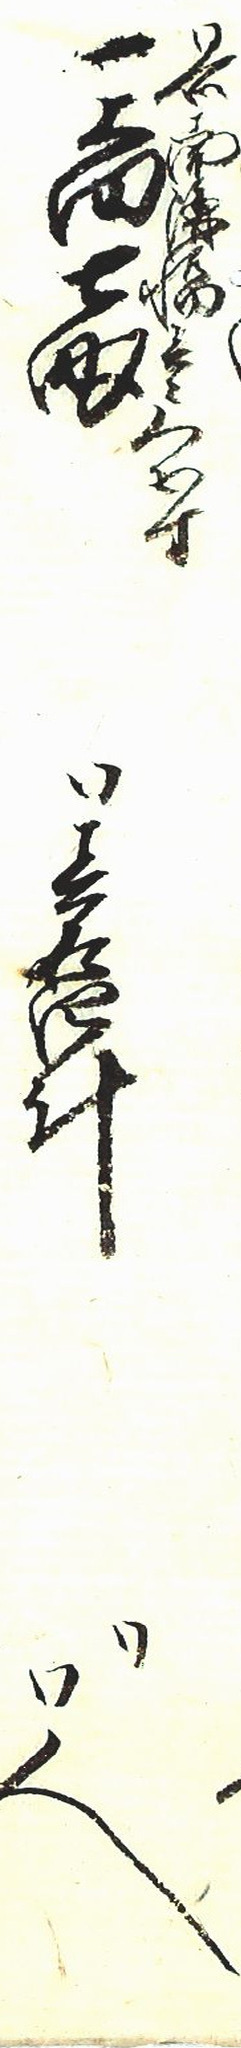一上田七畝同壱石四斗同人
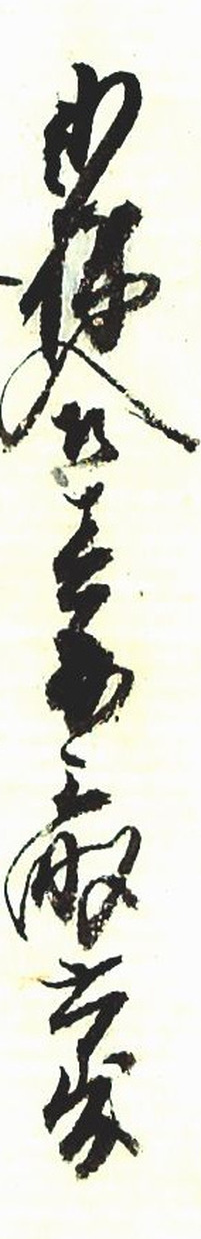弐株合壱反三畝六歩
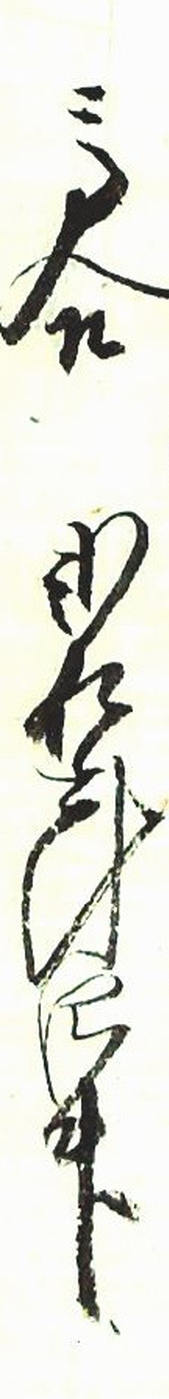高合弐石六斗四升
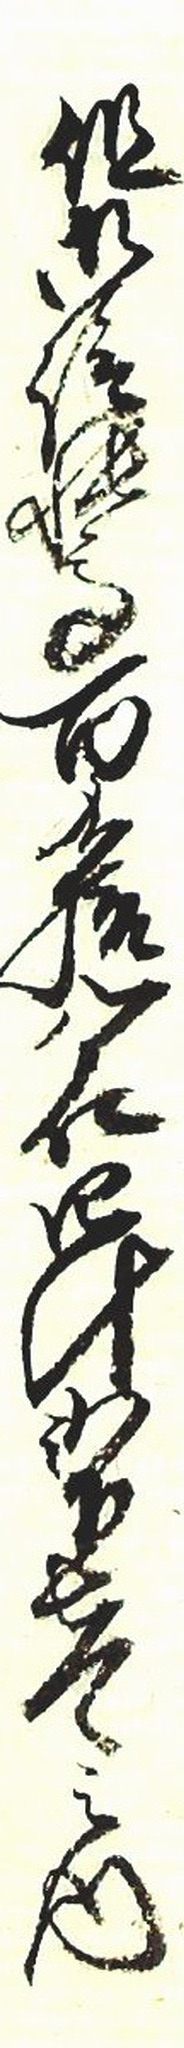但御請帳高百九拾八石四斗弐升七合之内
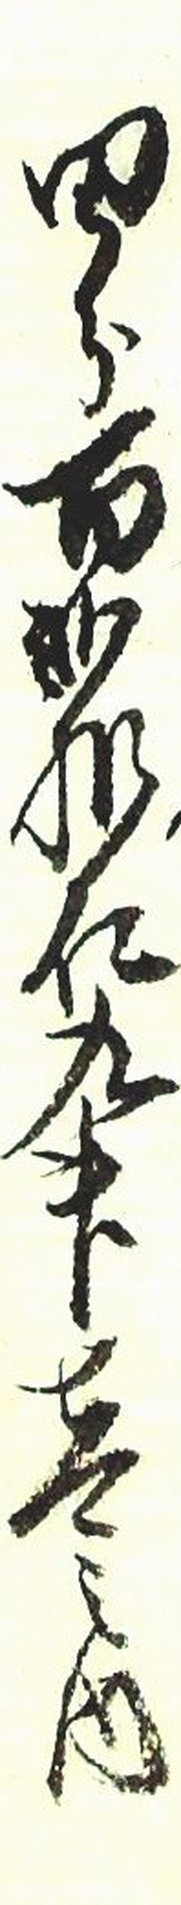田分百弍拾石九升七合之内
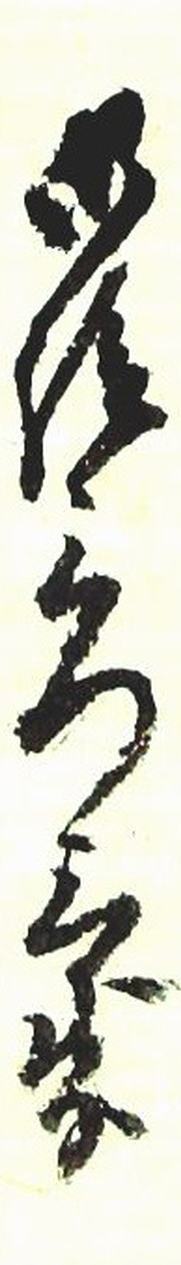御請三つ三歩
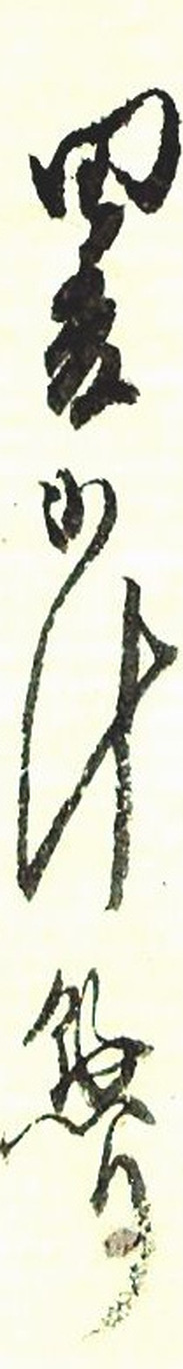田取弐斗懸り
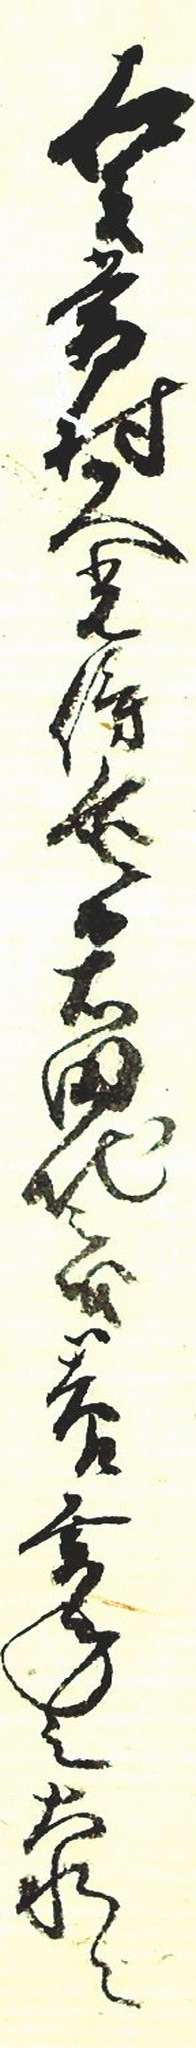右は当村久光傍示にて右田地之義は去る亥年之大水に
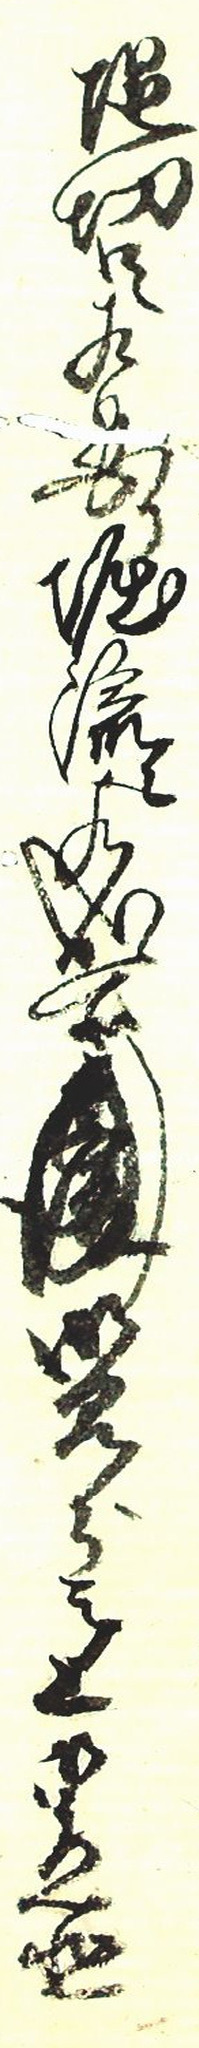堤切口へ相当り堀流に相成候所御見分之上御慈悲
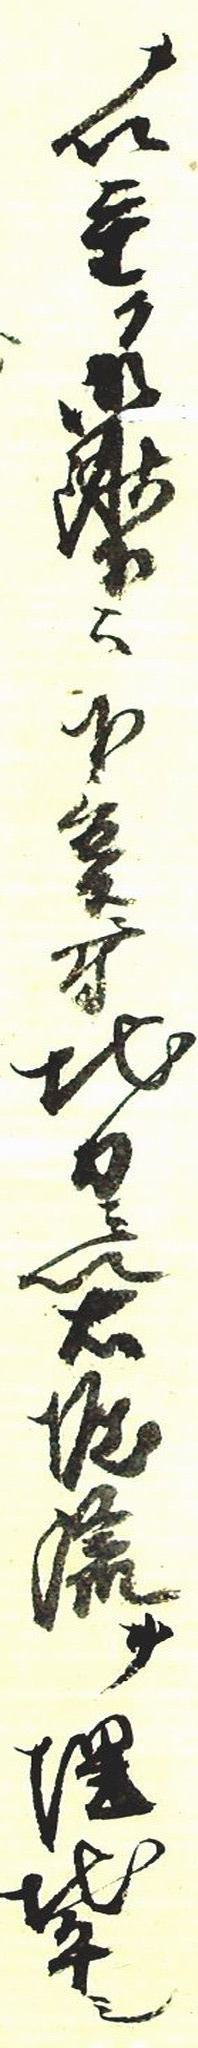を以重く御鍬下被下置候に付地力を以右堀流を埋地平し
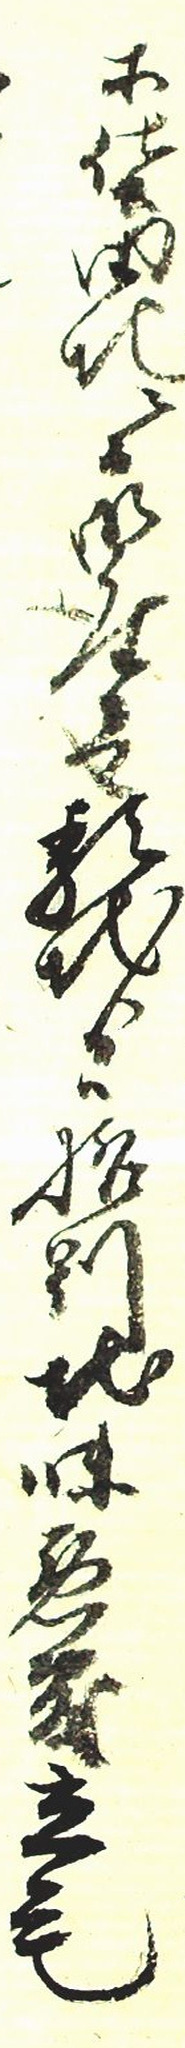等仕候田地にて御座候類地ゟは格別地味悪敷立毛
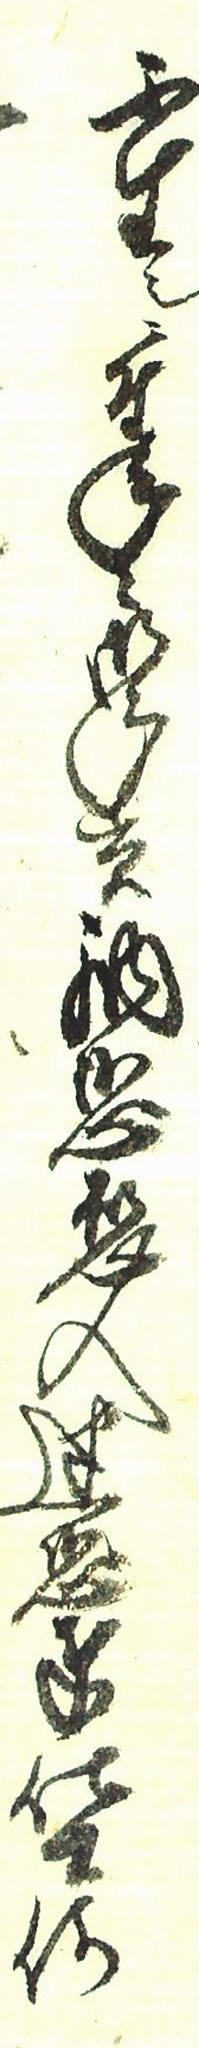不生しに付年々御年貢納恐想入迷惑奉仕候何
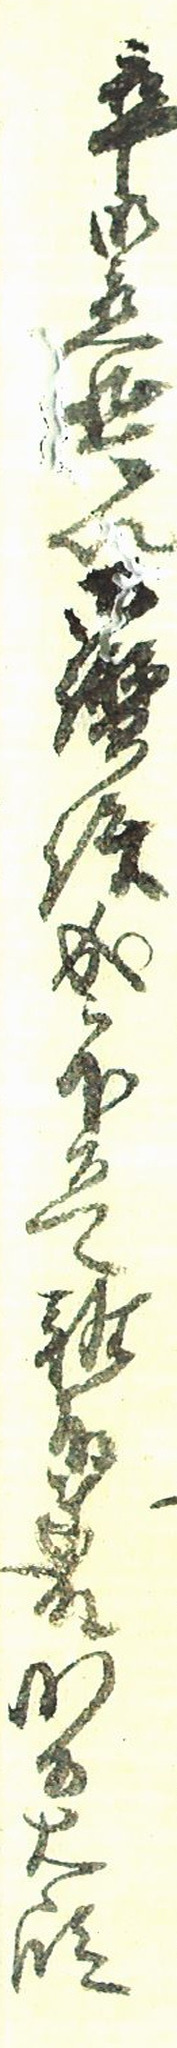卒御慈悲を以御讃談成被下候はゝ難有奉存候仍て右之段
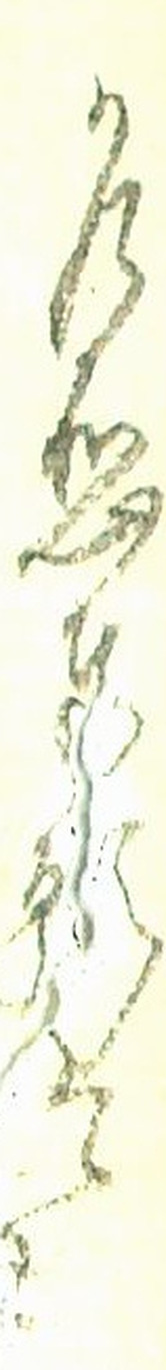乍恐奉願上候以上
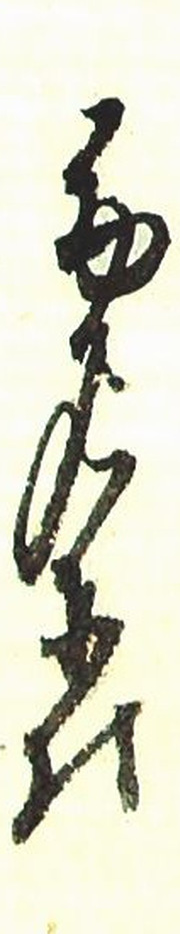西名東村
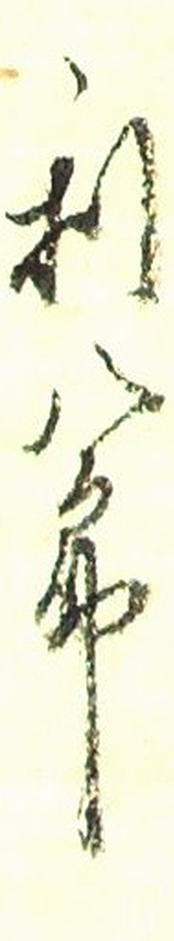利八郎
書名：諸御願書控(弐番）
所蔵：鳴門教育大学 Naruto University of Education
